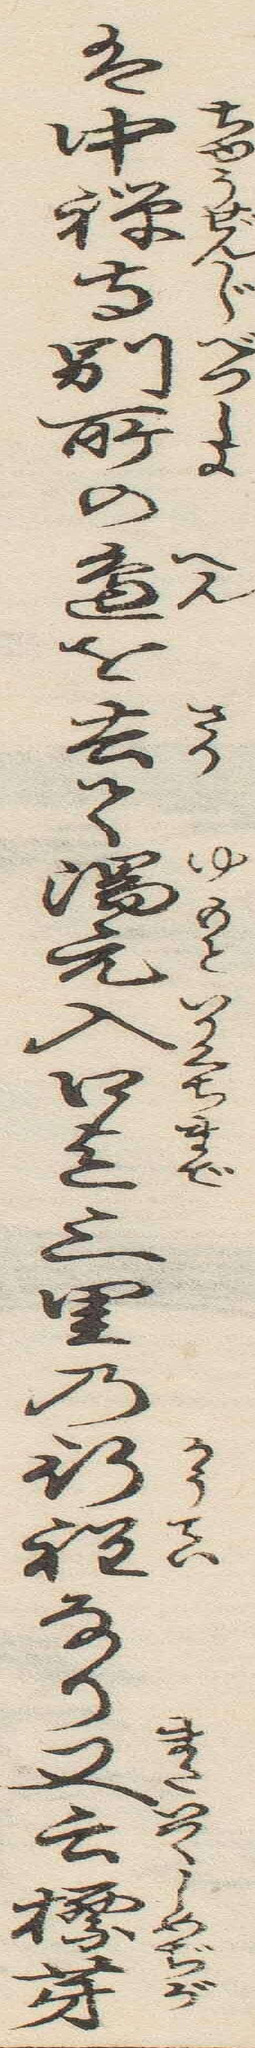は中禅寺別所の邊を去て湯元入口迄三里の行程なり又云標芽
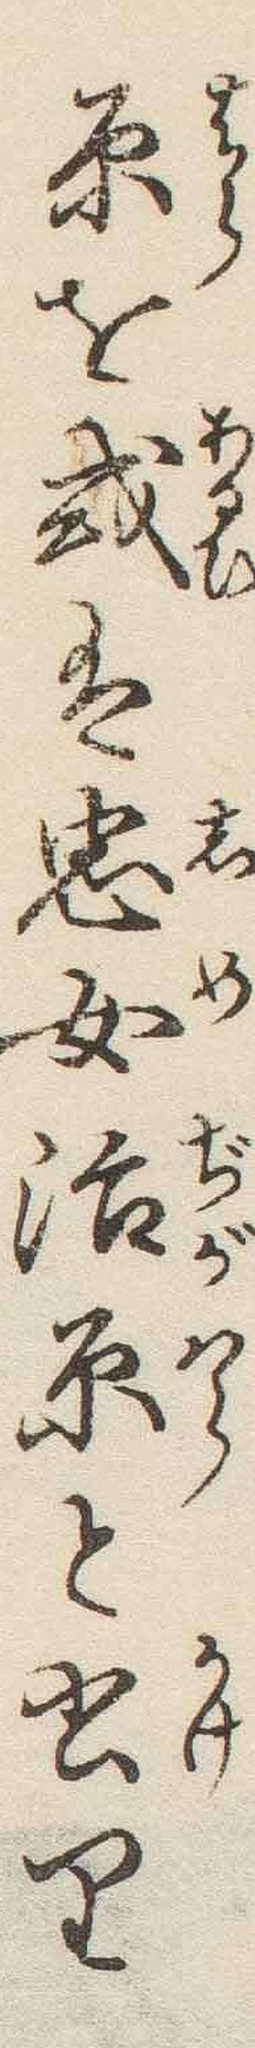原を或は忠女治原と書り
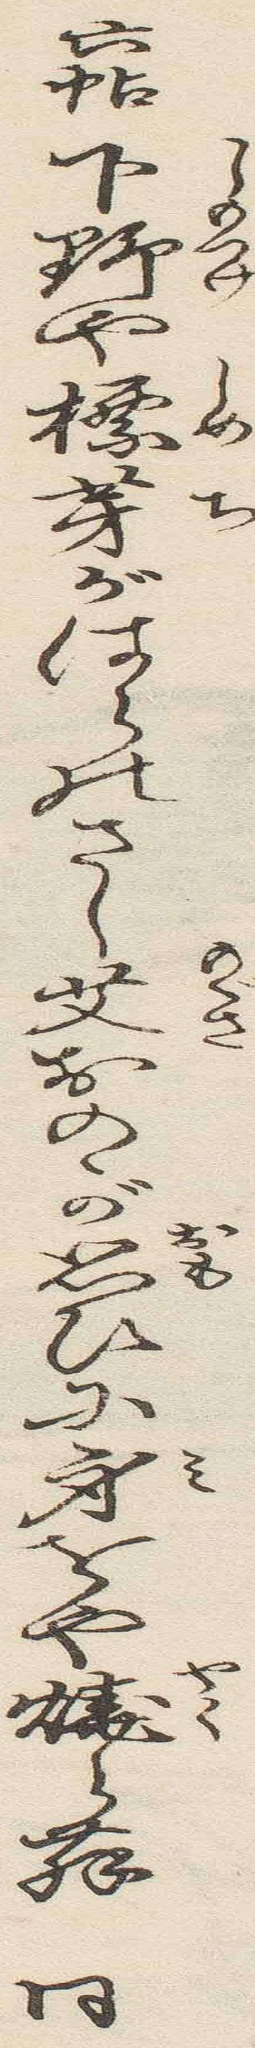六帖下野や標芽がはらのさし艾おのが思ひに身をや燒らむ同
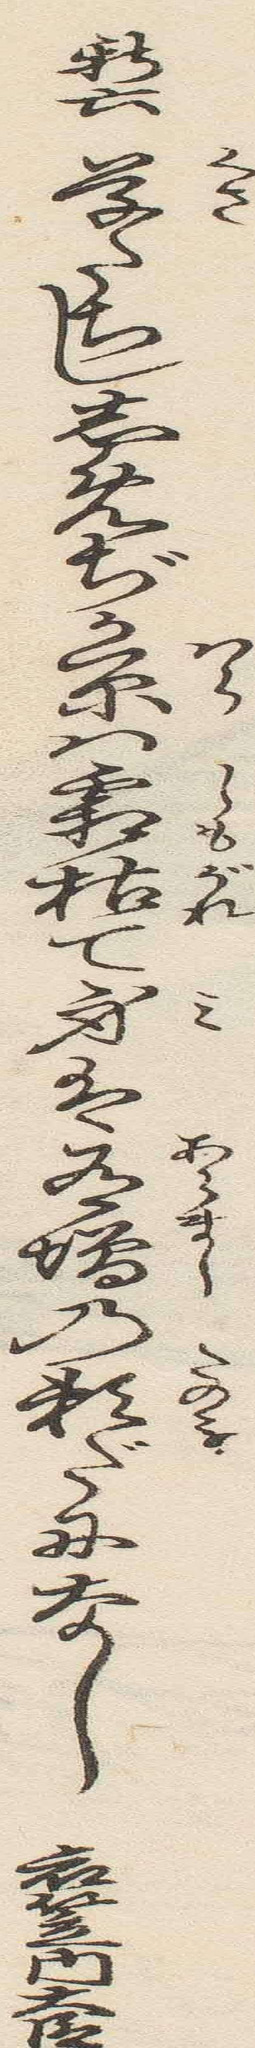新六草たちししめぢか原は霜枯て身は有増の頼だになし衣笠内大臣
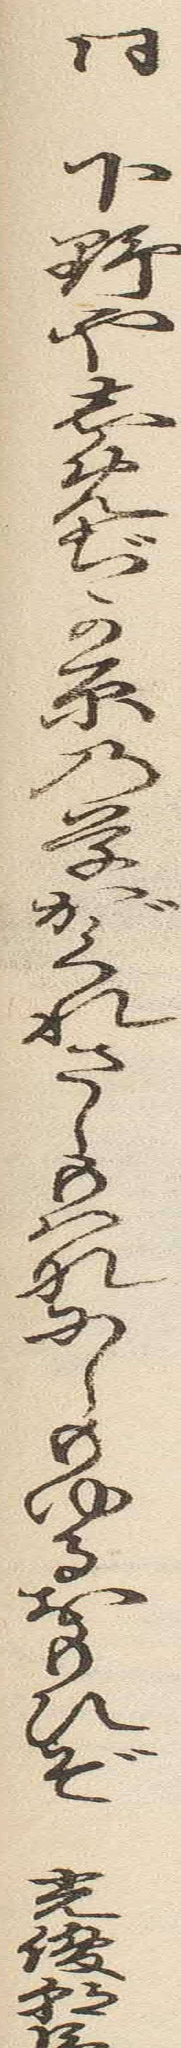同下野やしめぢか原の草がくれさしもはなにしもゆるおもひぞ光俊朝臣
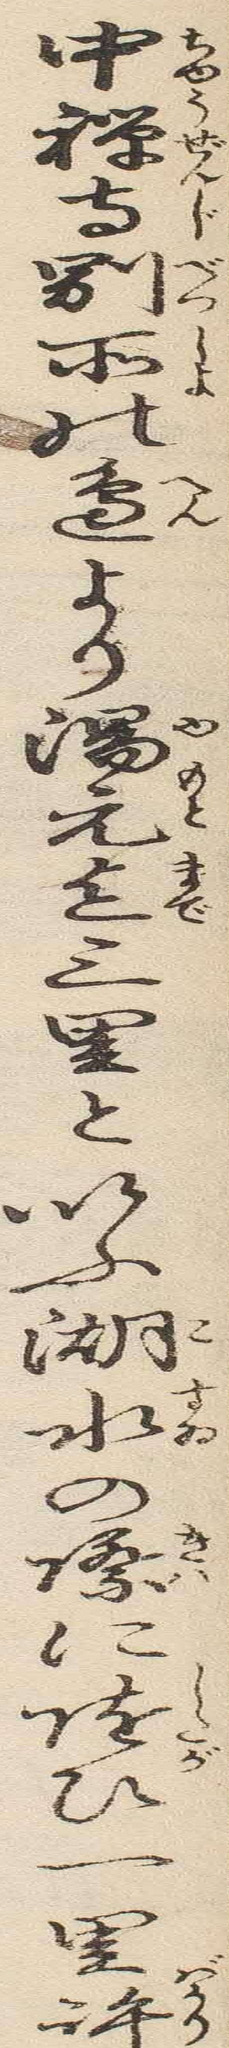中禅寺別所の邊より湯元迄三里といふ湖水の際に随ひ一里許
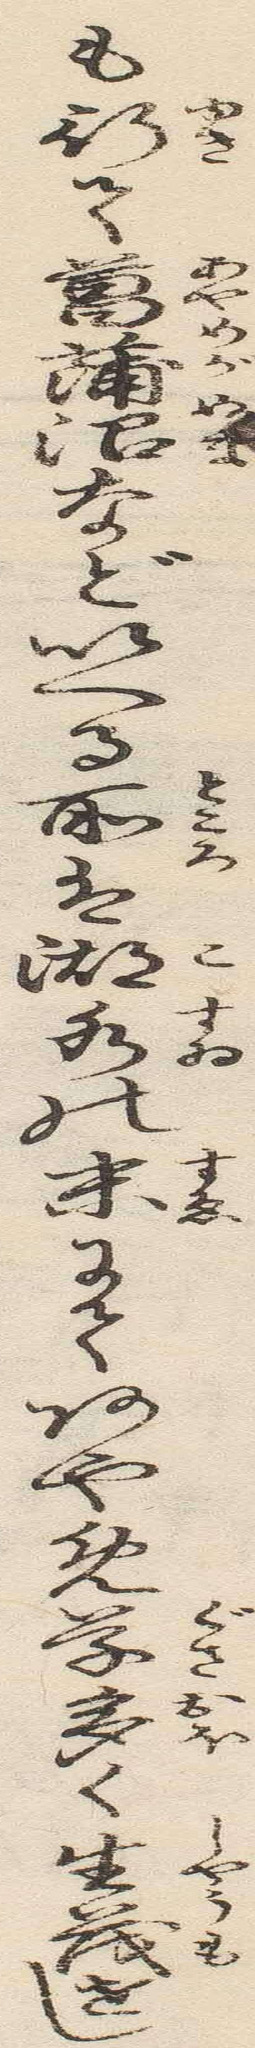も行て菖蒲沼などいへる所は湖水の末にてあやめ草多く生茂せし
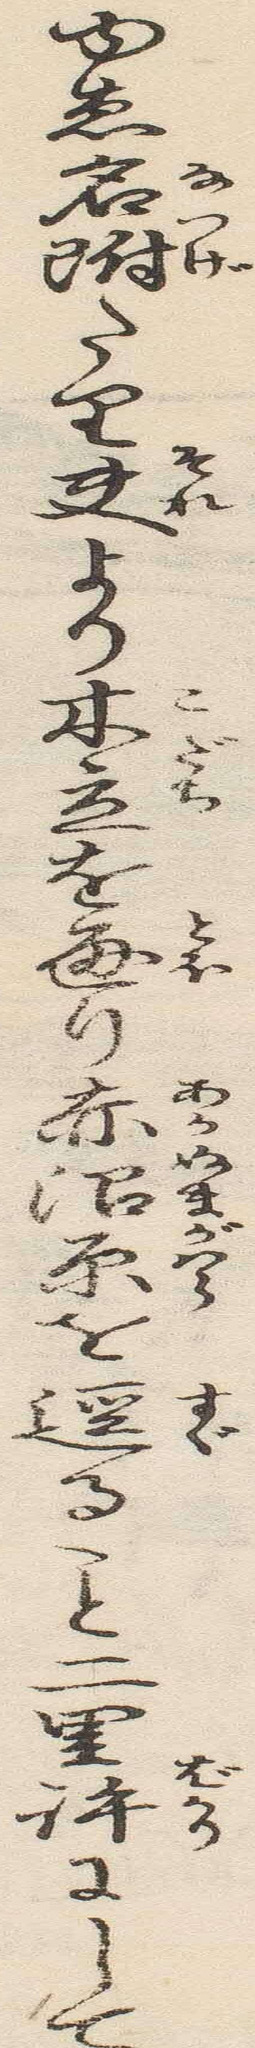ゆゑ名附たり夫より木立を通り赤沼原を逕ること二里許にして
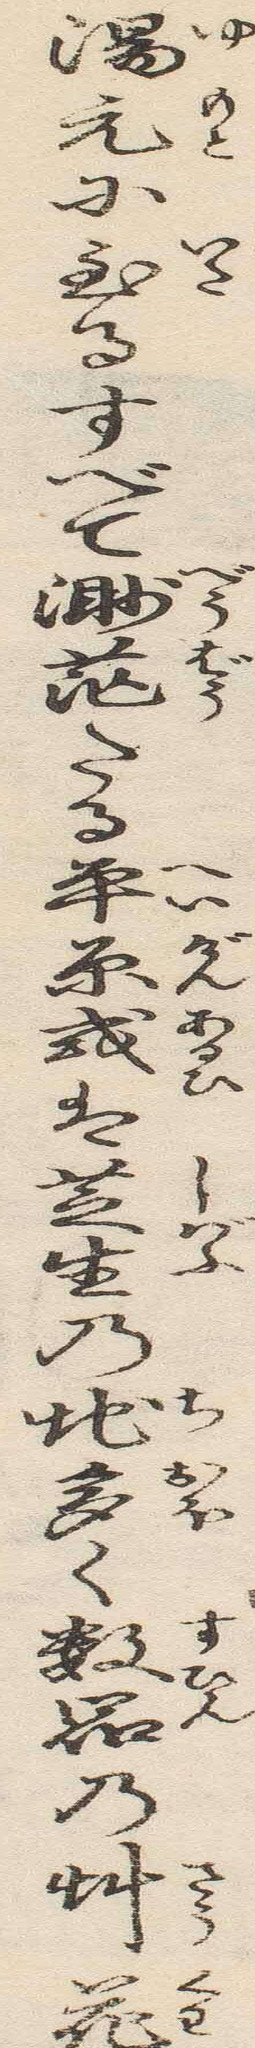湯元に至るすべて渺茫たる平原或は芝生の地多く数品の艸花
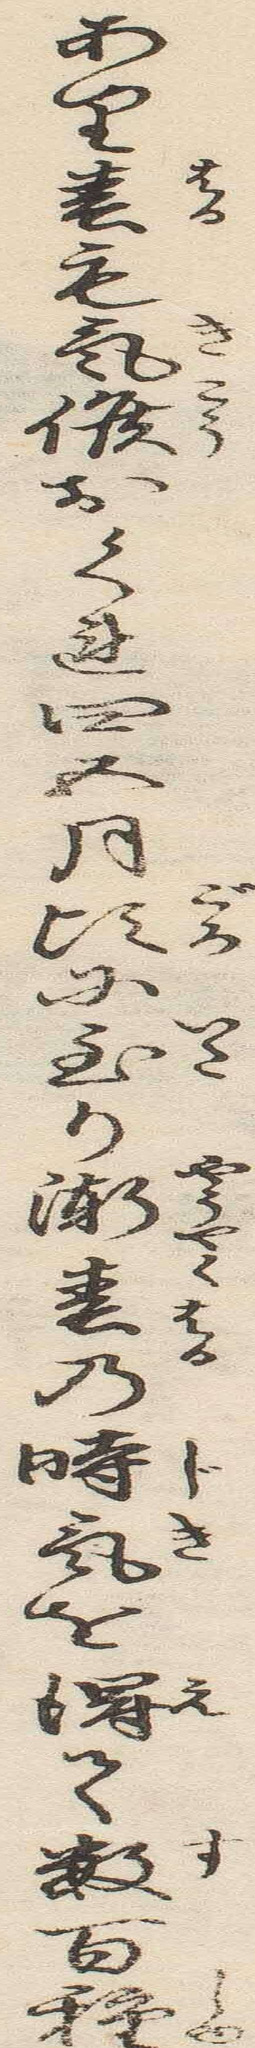あり春も気𠊱おくれ四五月頃に至り漸春の時気を得て数百種
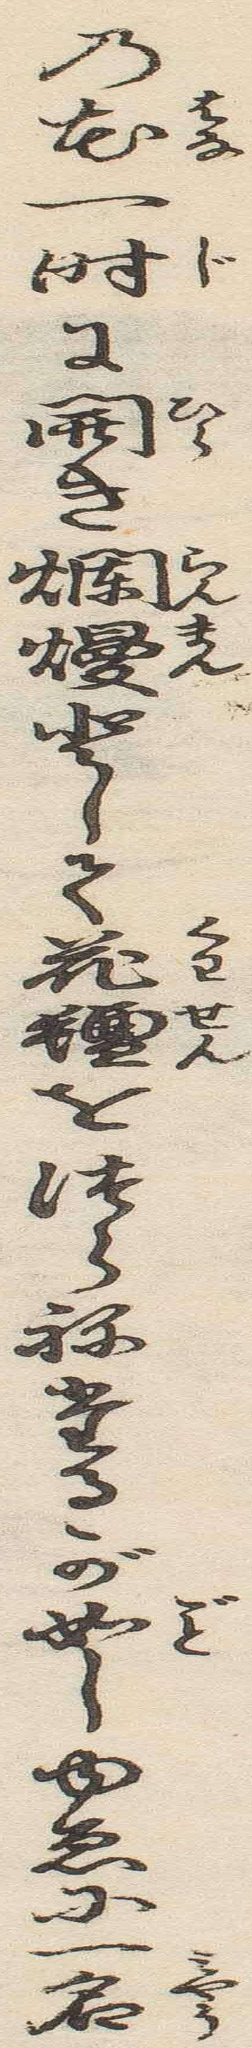の花一时に開き爛漫として花氊をつらねたるが如しゆゑに一名
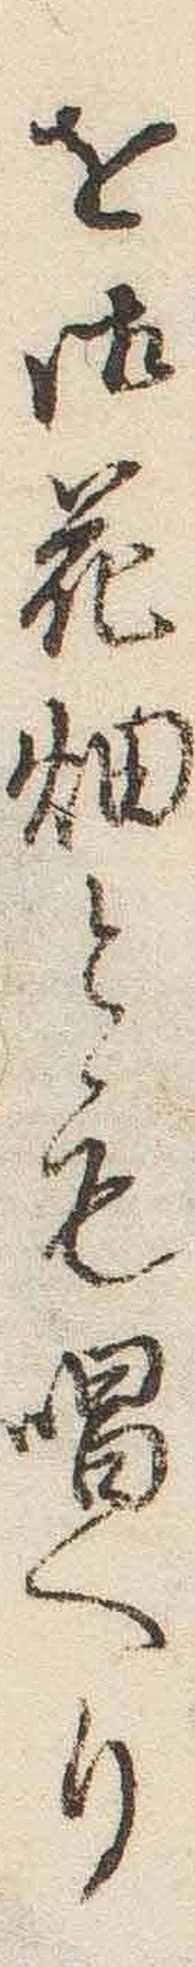を御花畑とも唱へり
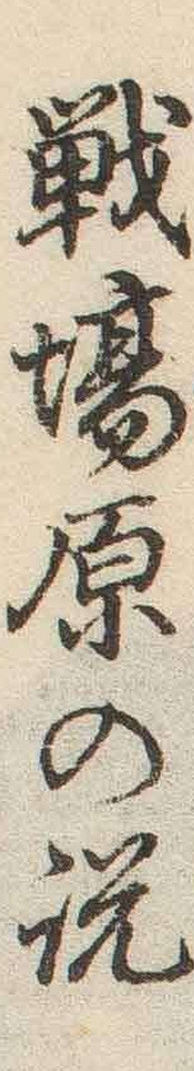戦塲原の説
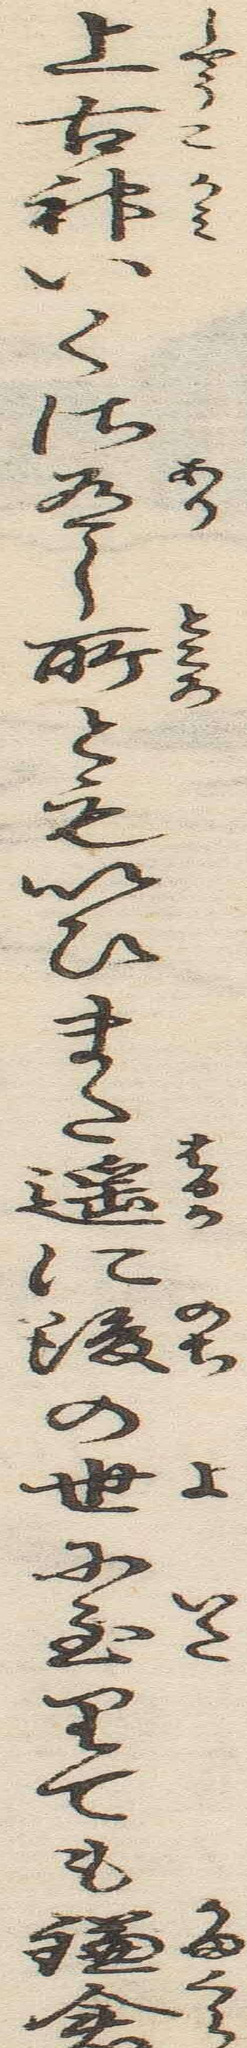上古神いくさ有し所ともいひまた遥に後の世に至りても鎌倉
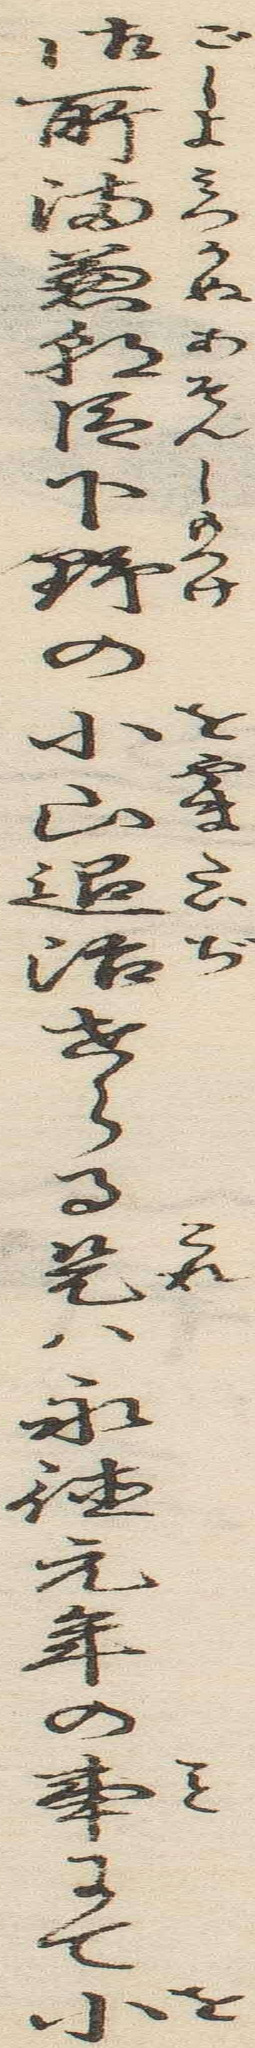御所満兼朝臣下野の小山退治せらる是は永徳元年の事にて小
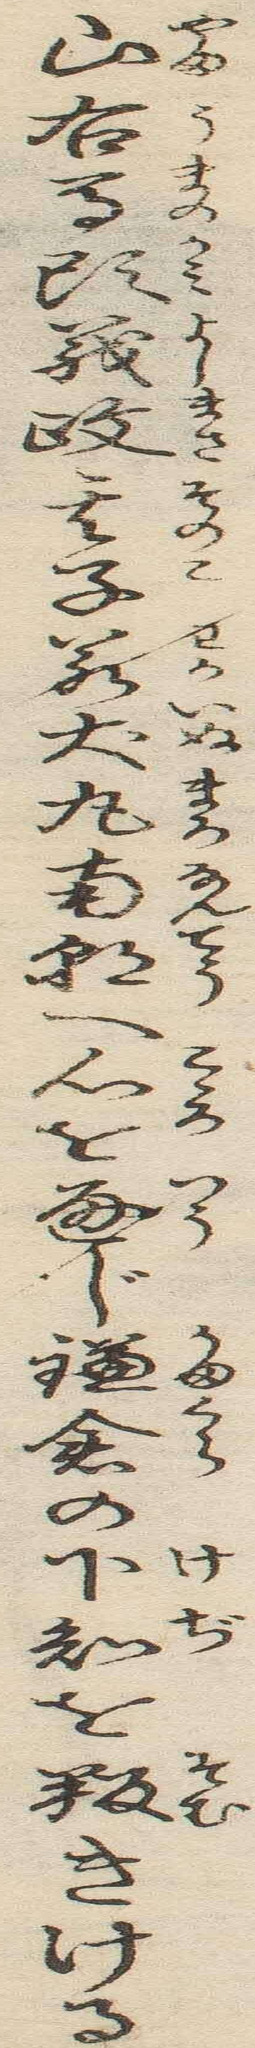山右馬頭義政其子若犬丸南朝へ心を通じ鎌倉の下知を叛きける
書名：日光山志
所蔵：東京学芸大学附属図書館 国文学研究資料館
